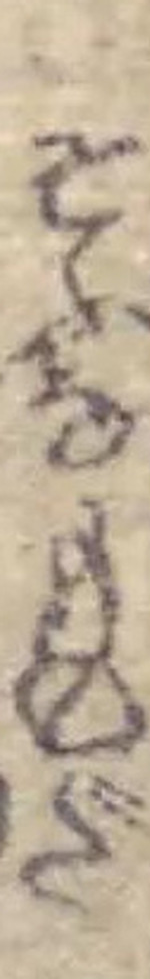そふなものだ
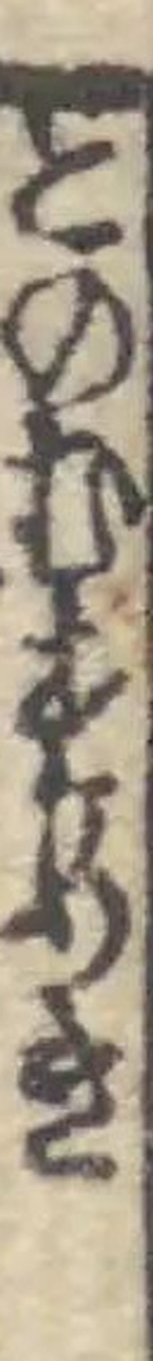このむすめき
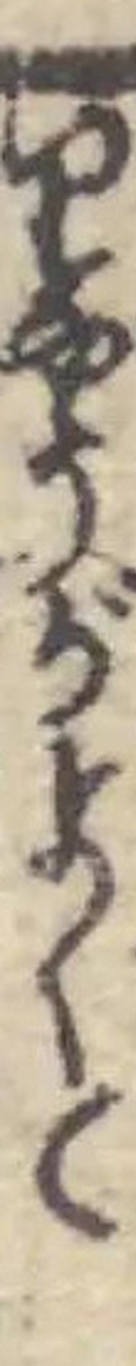りやうがよくて
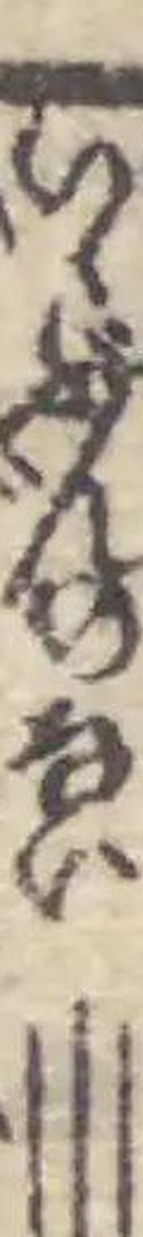いゝぶんのない
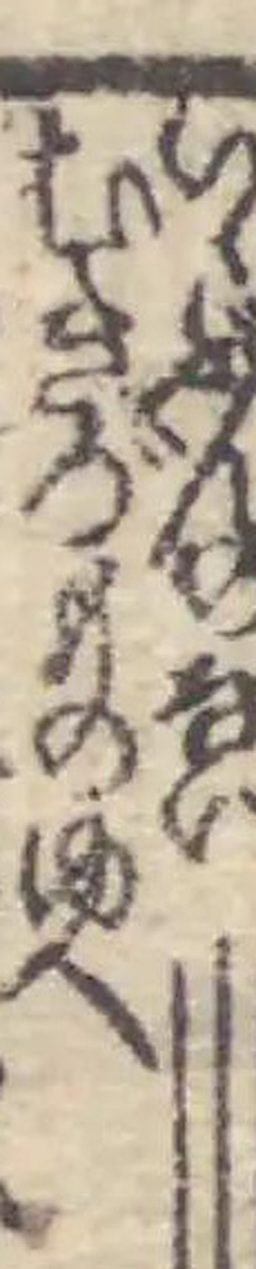むきがものゆへ
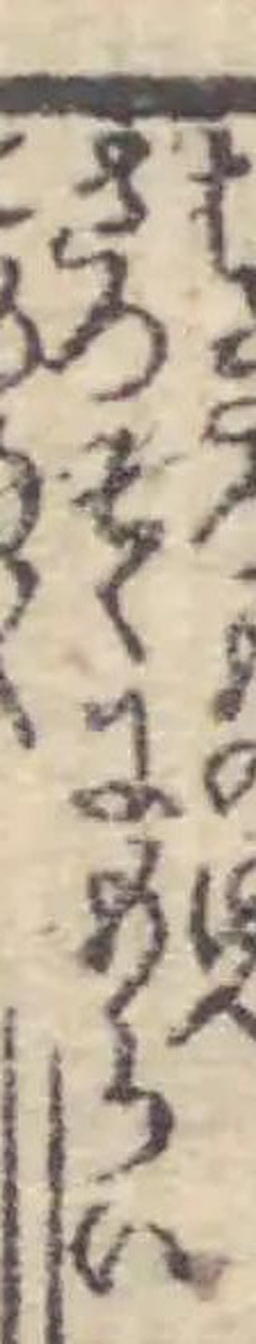さつそくにもらい
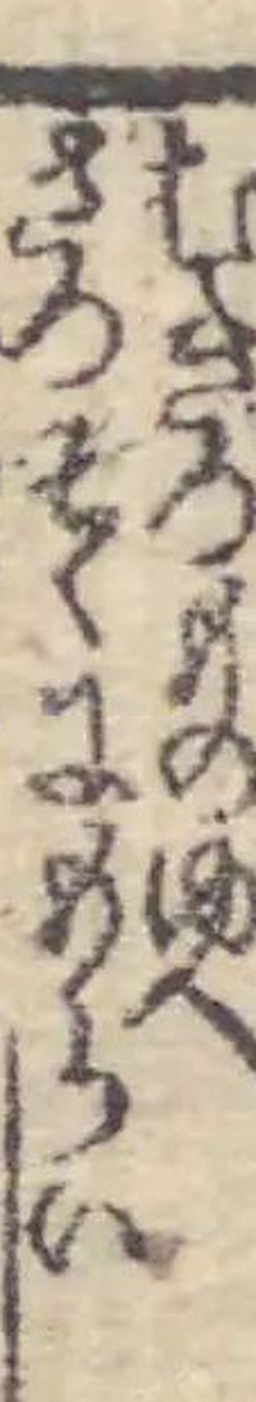さつそくにもらい
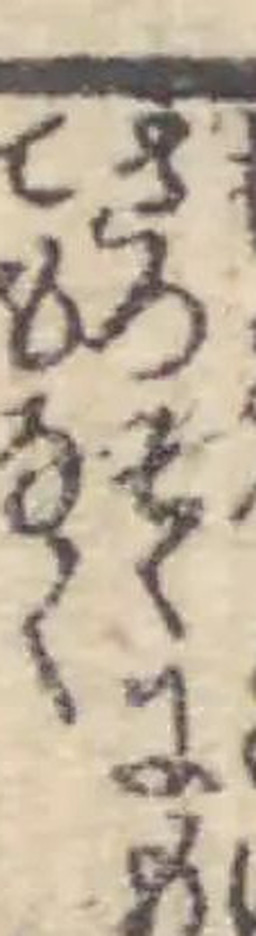てもなく
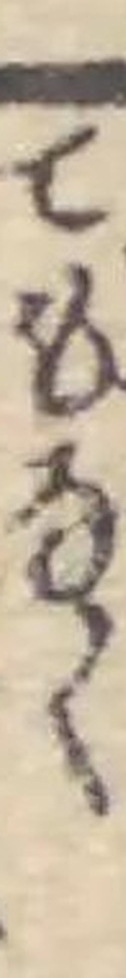てもなく
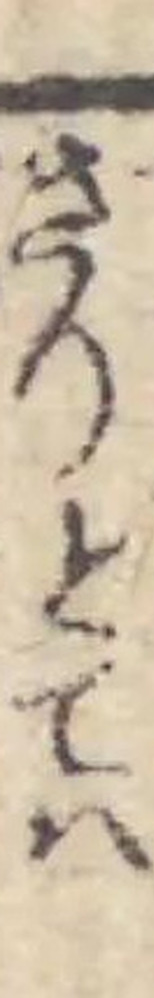さりとては
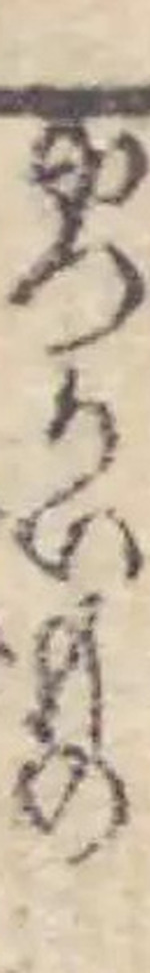やつかいもの
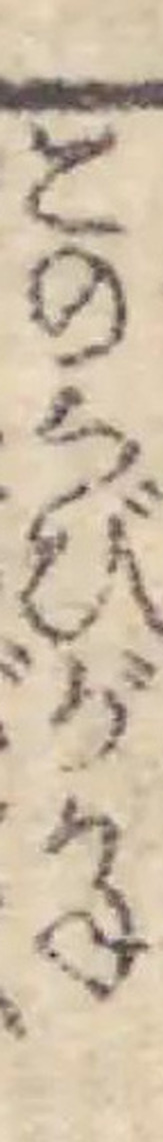このくびがかね
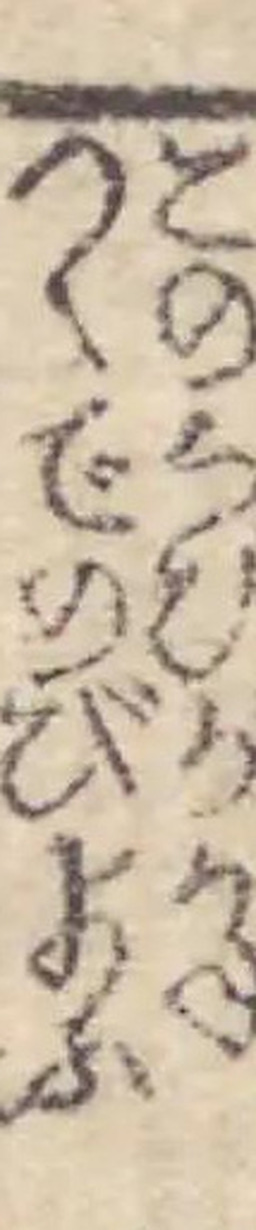つくでのびよふ
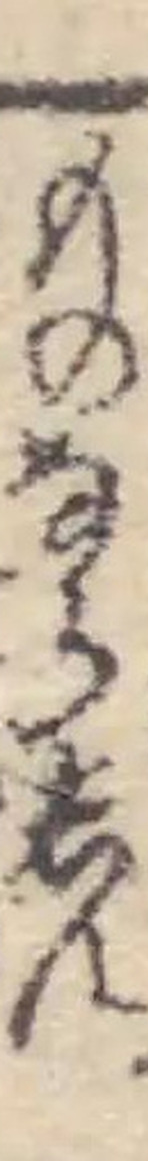ものならしん
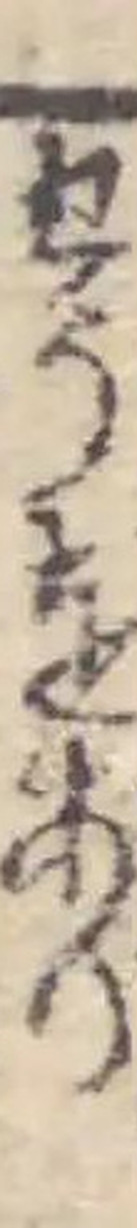せうをあり
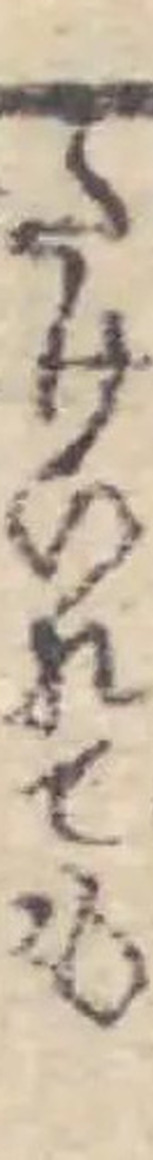たけいれても
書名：化物尽 4巻
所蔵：国立国会図書館 National Diet Library, JAPAN
